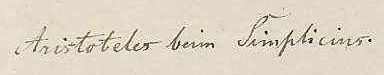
Aristoteles beim Simplicius.
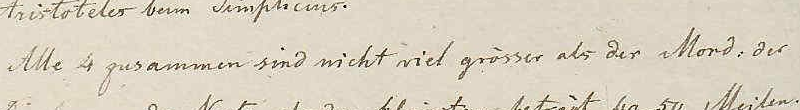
Alle 4 zusammen sind nicht viel grösser als der Mond: der
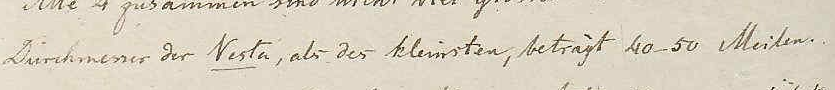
Durchmesser der Vesta, als des kleinsten, beträgt 40–50 Meilen.
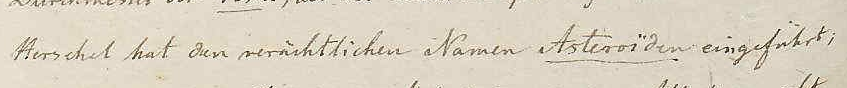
Herschel hat den verächtlichen Namen Asteroïden eingeführt;
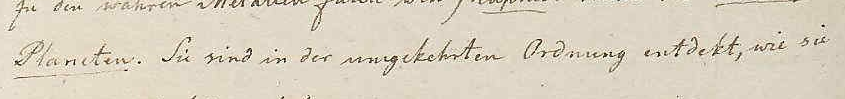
Planeten. Sie sind in der umgekehrten Ordnung entdekt, wie sie
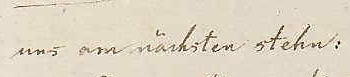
uns am nächsten stehn:
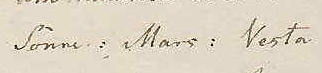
Sonne: Mars: Vesta
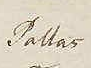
zeit der
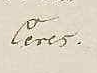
Monaten,
